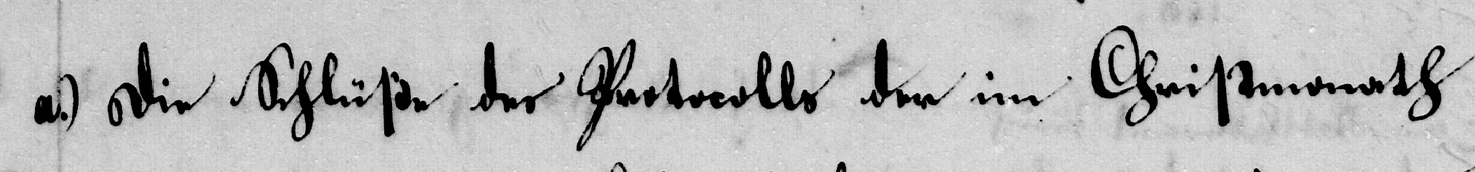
a.) Die Schlüße des Protocolls der im Christmonath
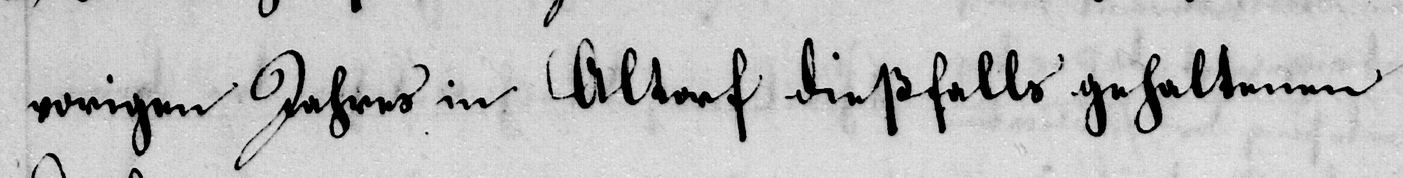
vorigen Jahres in Altorf dießfalls gehaltenen
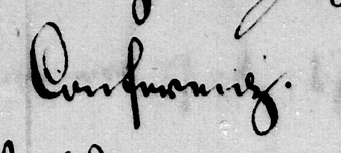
Conferenz.
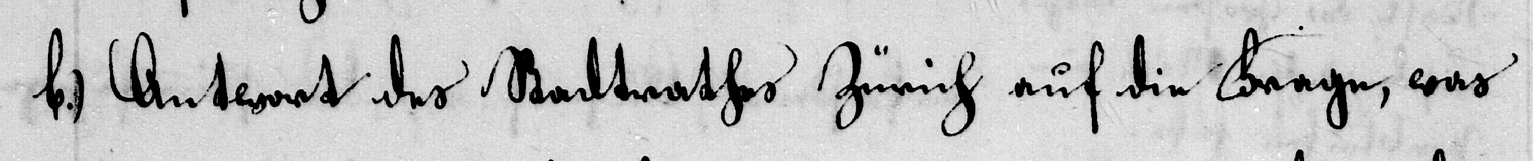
b.) Antwort des Stadtrathes Zürich auf die Frage, was
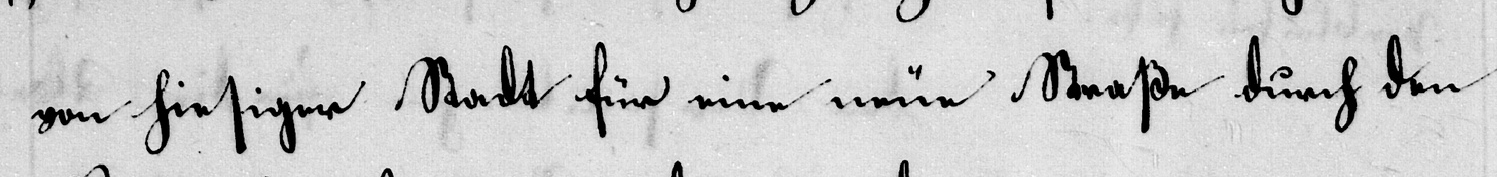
von hiesiger Stadt für eine neue Straße durch den
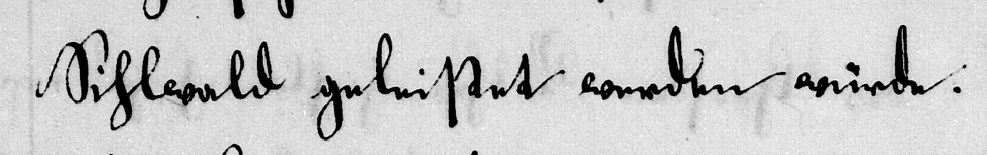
Sihlwald geleistet werden würde.
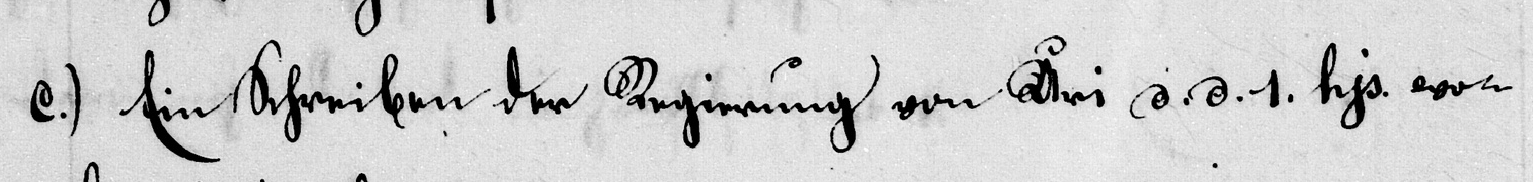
c.) Ein Schreiben der Regierung von Uri d. d. 1. hjs. wo¬
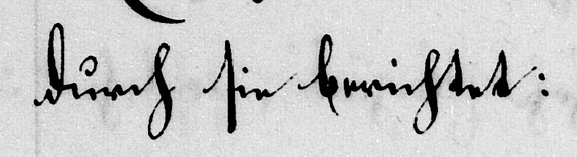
durch sie berichtet:
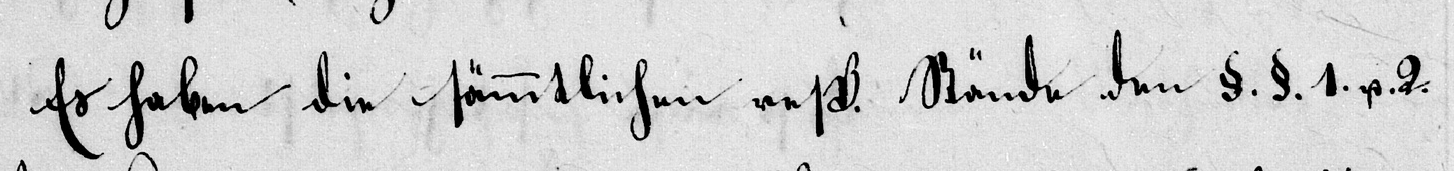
Es haben die sämmtlichen resp. Stände den §. §. 1. u. 2.
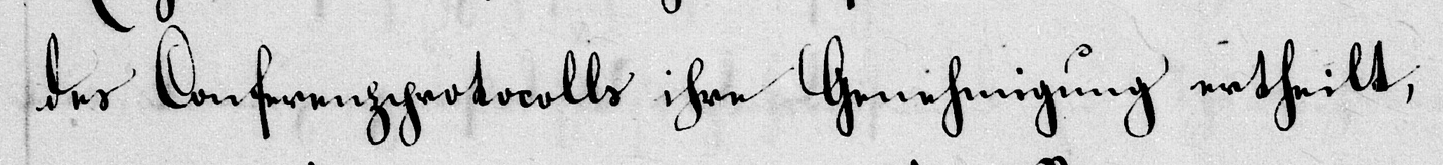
des Conferenzprotocolls ihre Genehmigung ertheilt,
